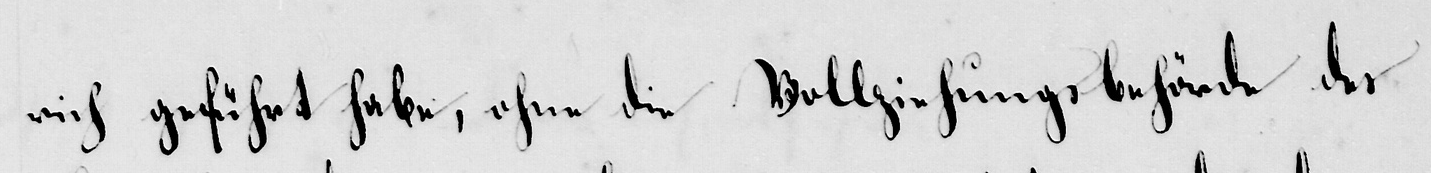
rich geführt habe, ohne die Vollziehungsbehörde des
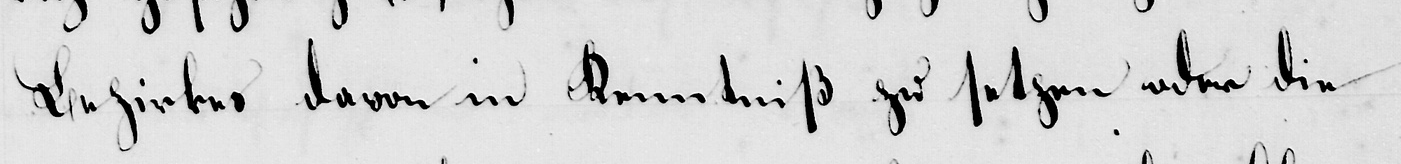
Bezirkes davon in Kenntniß zu setzen oder die
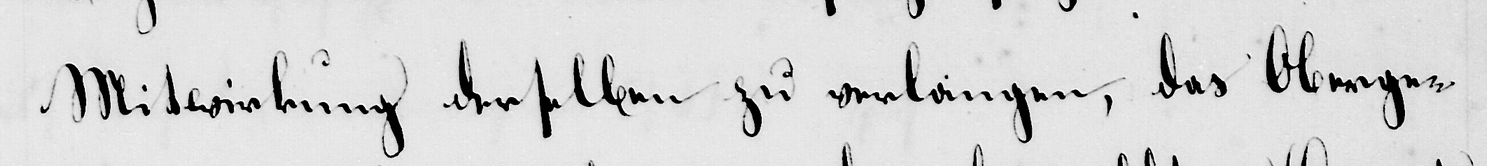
Mitwirkung derselben zu verlangen, das Oberge¬
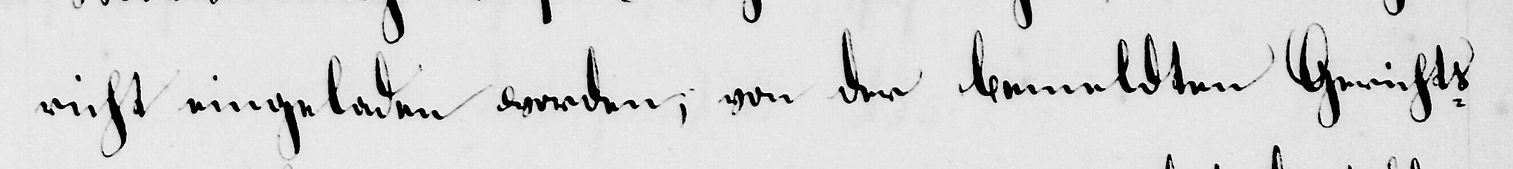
richt eingeladen worden, von der bemeldten Gerichts¬
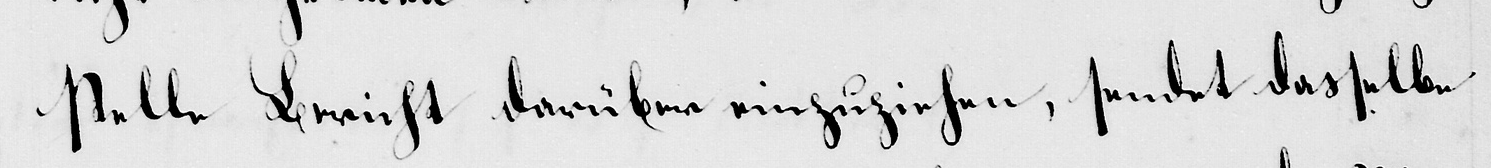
stelle Bericht darüber einzuziehen, sendet dasselbe
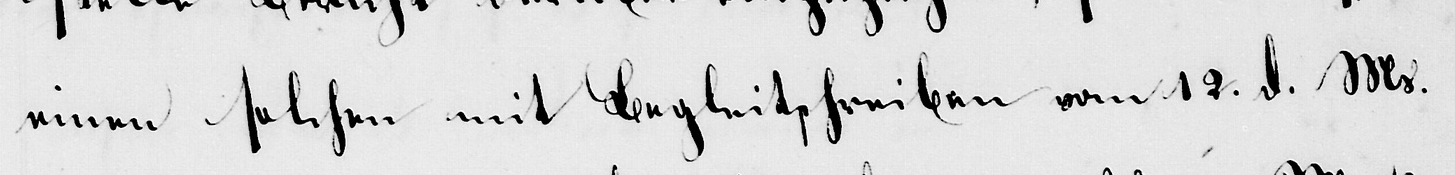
einen solchen mit Begleitschreiben vom 12. d. Ms.
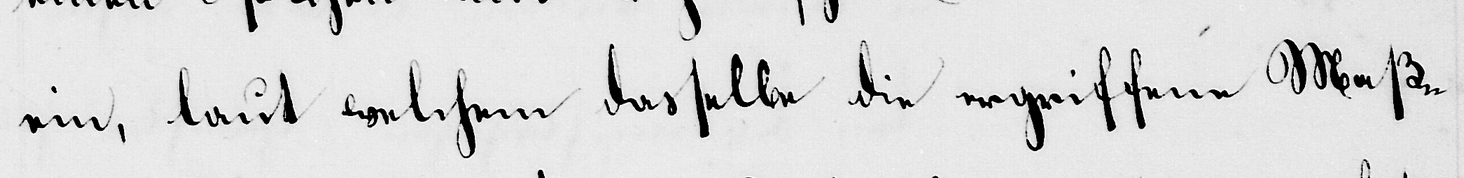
ein, laut welchem dasselbe die ergriffene Maß¬
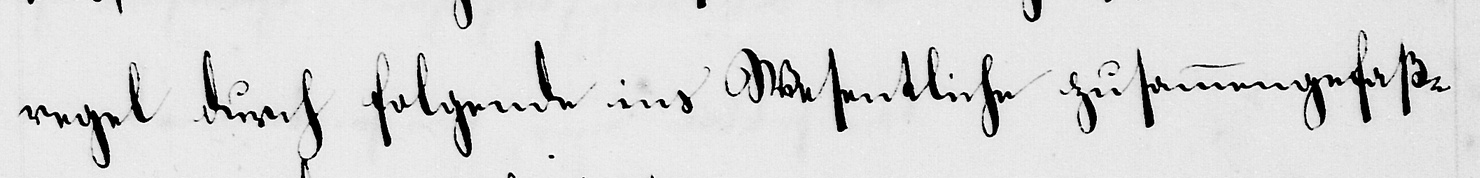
regel durch folgende ins Wesentliche zusammengefaß¬
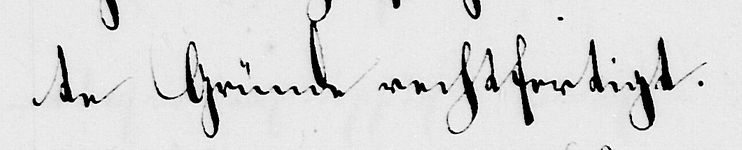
te Gründe rechtfertigt.
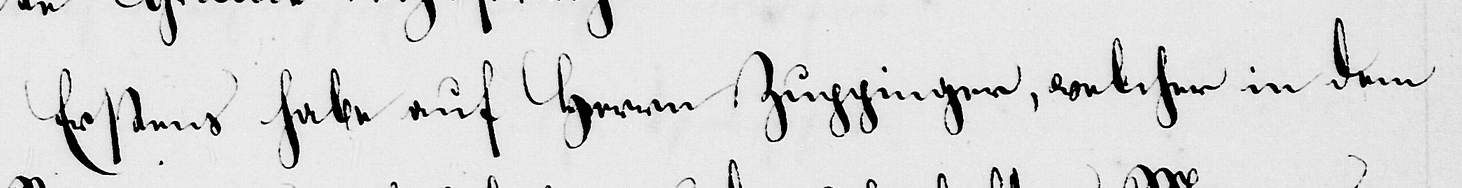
Erstens habe auf Herrn Zuppinger, welcher in dem
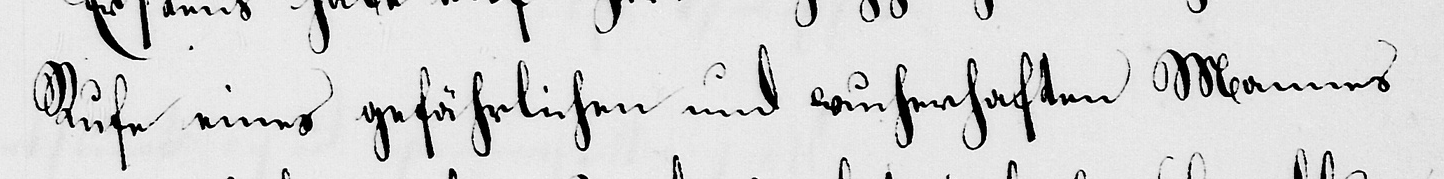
Rufe eines gefährlichen und wucherhaften Mannes
